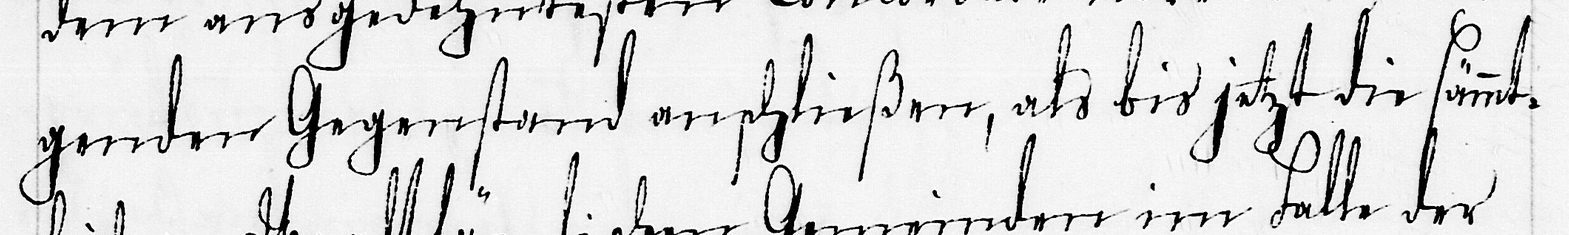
genden Gegenstand anschließen, als bis jetzt die sämm¬
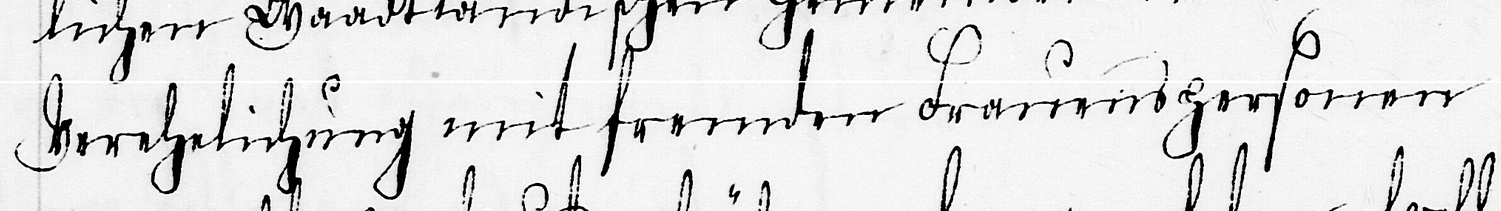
Verehelichung mit fremden Frauenspersonen
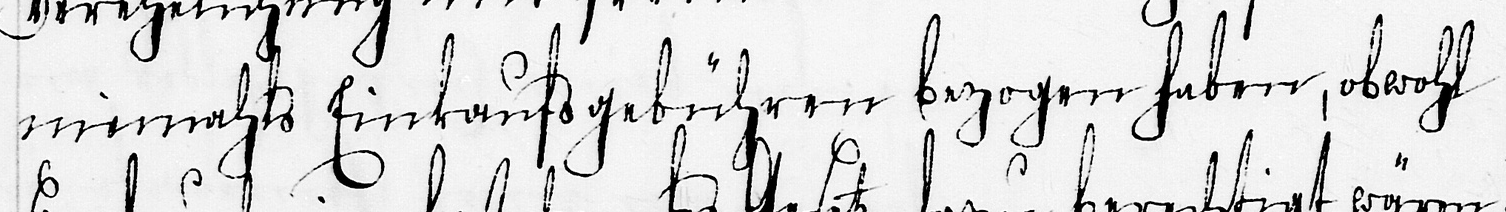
niemahls Einkaufsgebühren bezogen haben, obwohl
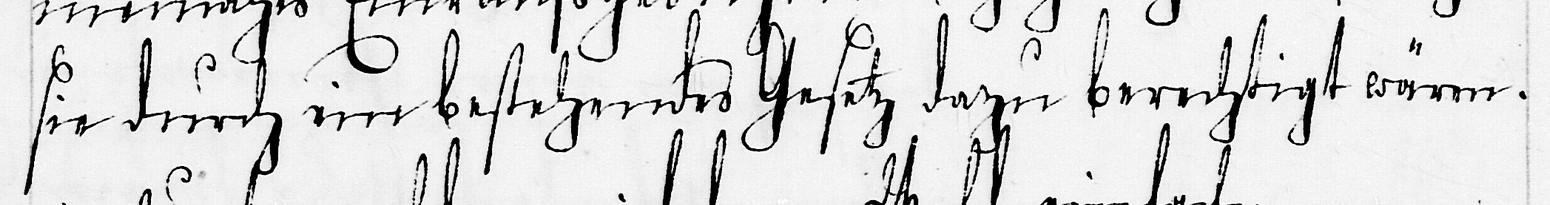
sie durch ein bestehendes Gesetz dazu berechtigt wären.
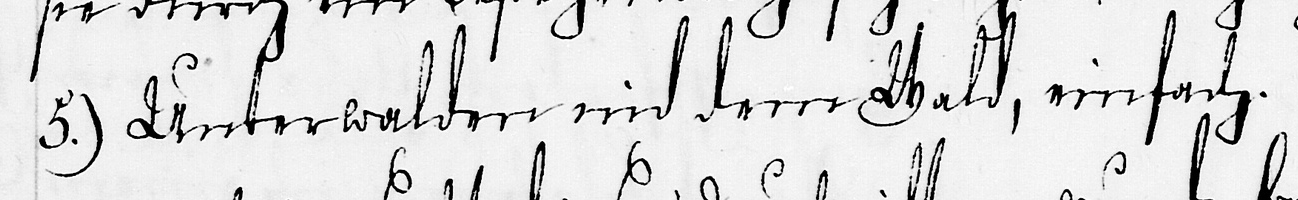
5.) Unterwalden nid dem Wald, einfach.
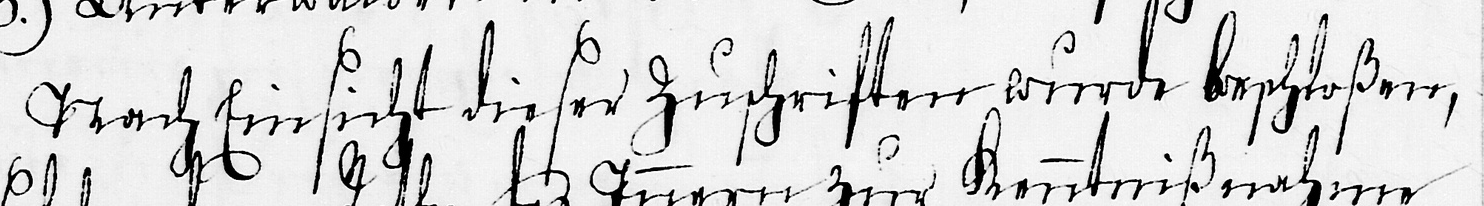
Nach Einsicht dieser Zuschriften wurde beschloßen,
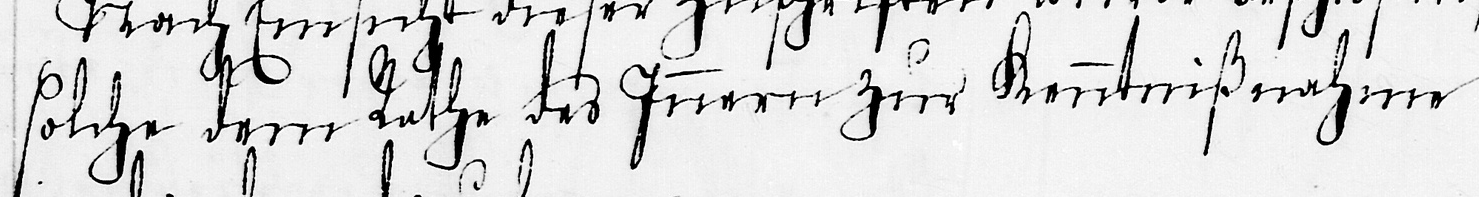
solche dem Rathe des Innern zur Kenntnißnahme
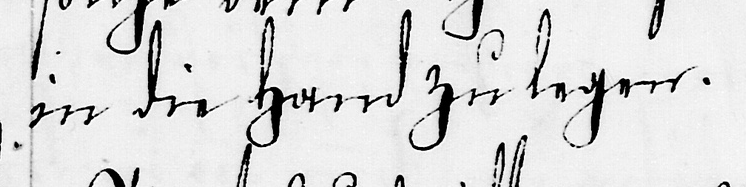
in die Hand zu legen.
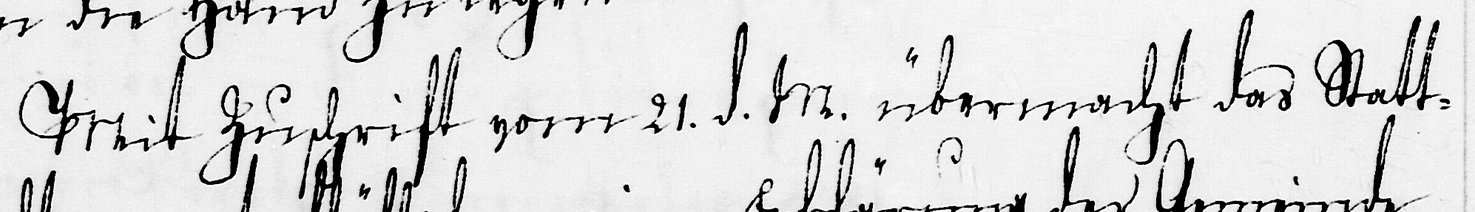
Mit Zuschrift vom 21. d. M. übermacht das Statt¬
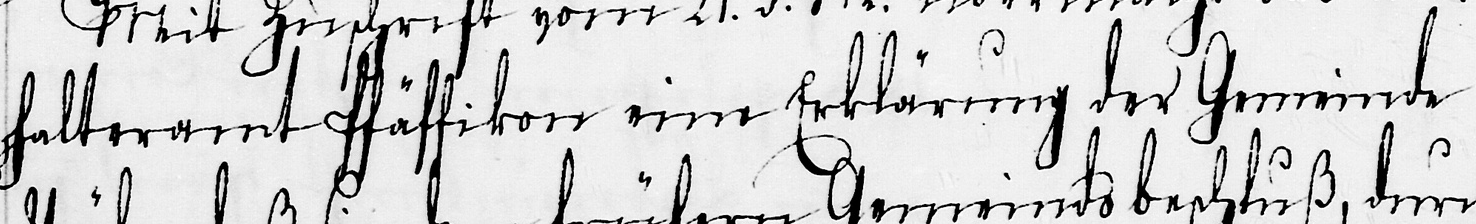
halteramt Pfäffikon eine Erklärung der Gemeinde
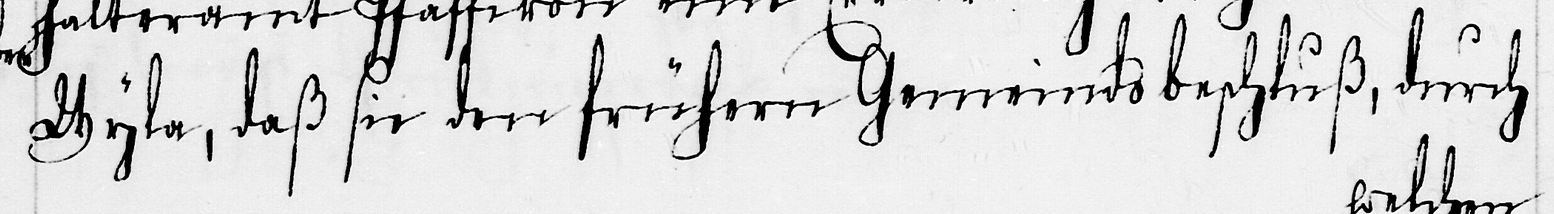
Wyla, daß sie den frühern Gemeindsbeschluß, durch
